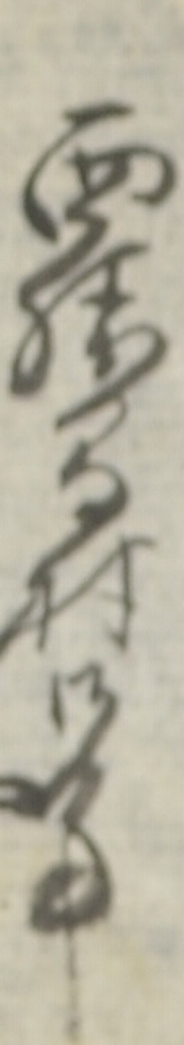西勝間村御事
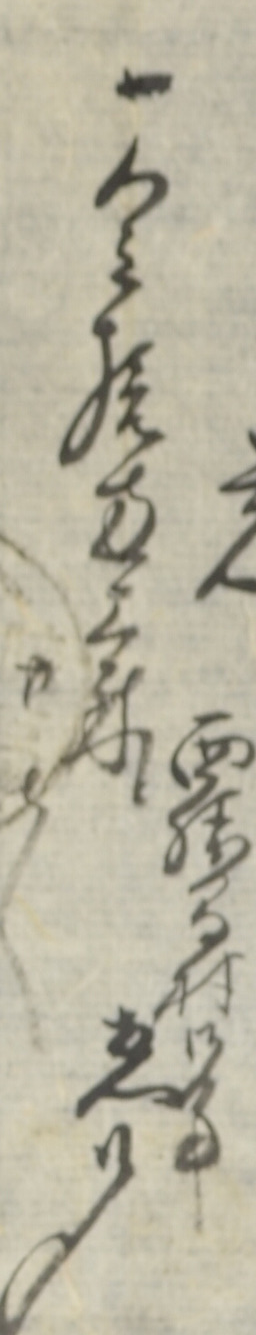一金拾両三朱と恵〆
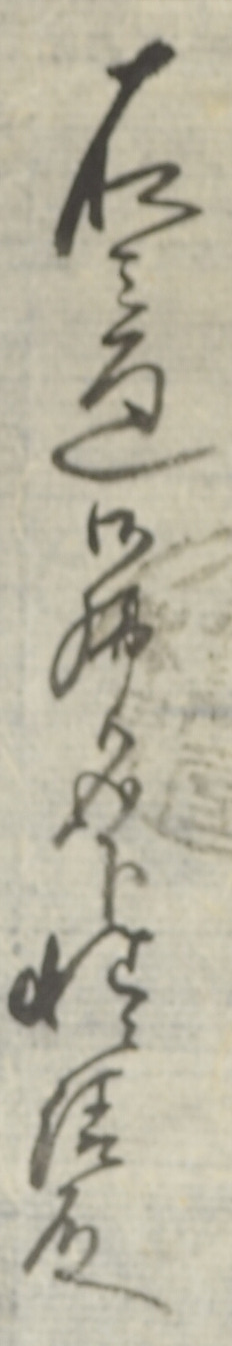右之通御払被成下慥二請取
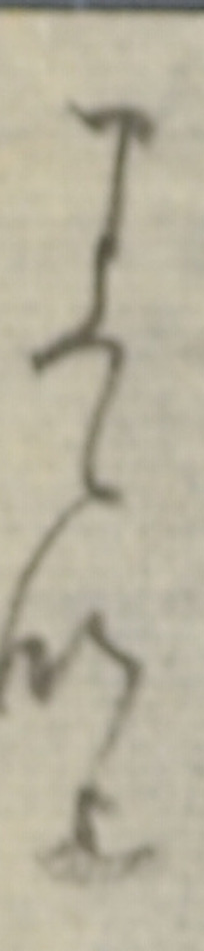申上候以上
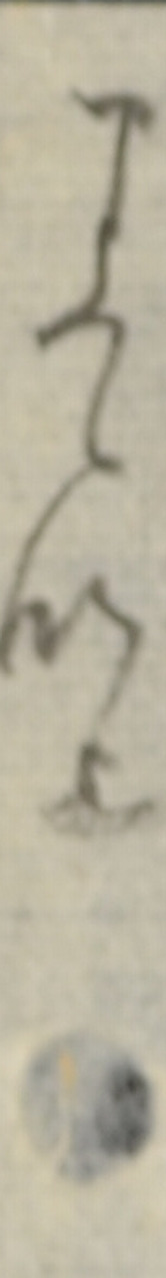申上候以上
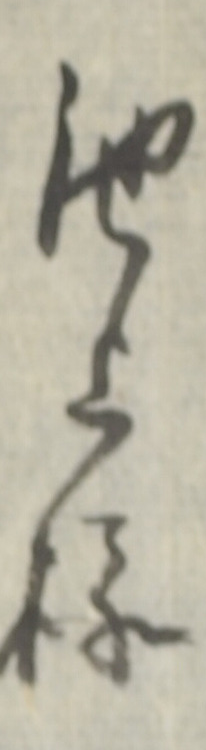池上様
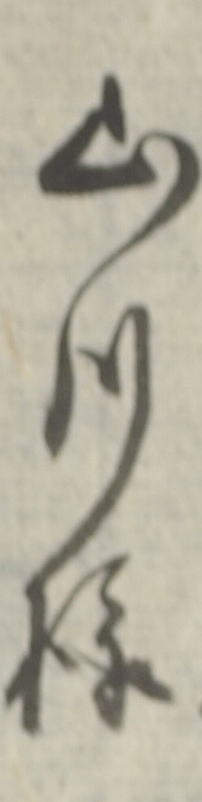山川様

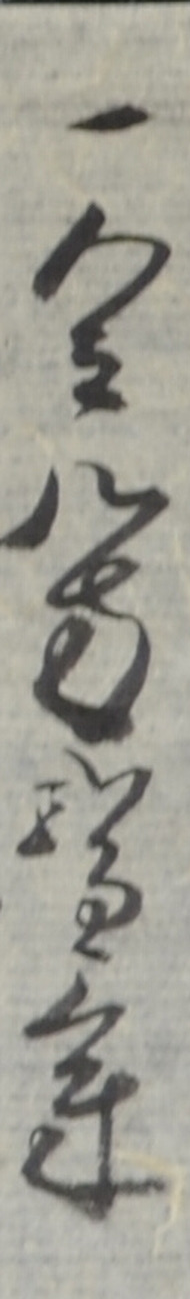〆金八両弐分三朱
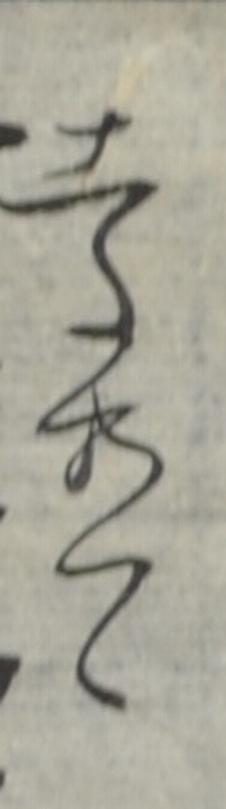十一月廿一日
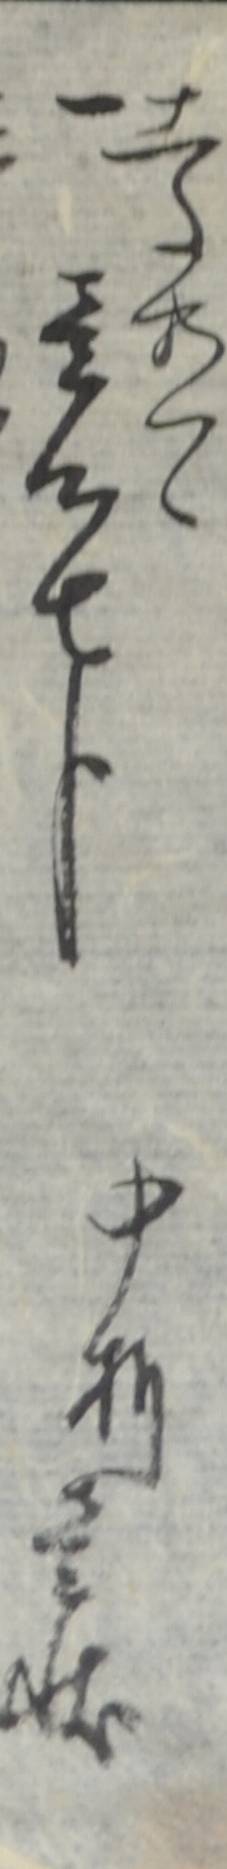一壱匁七分中折壱状
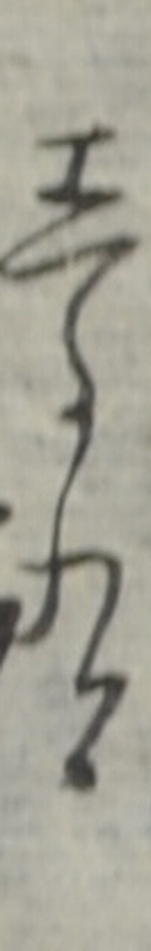十一月九日
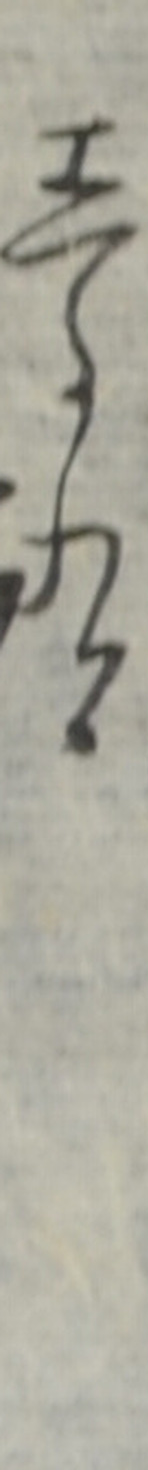十一月九日
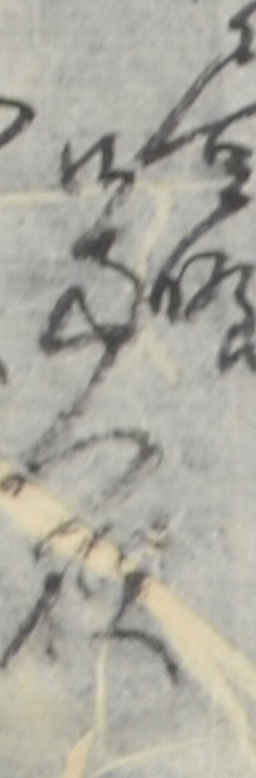御両人様
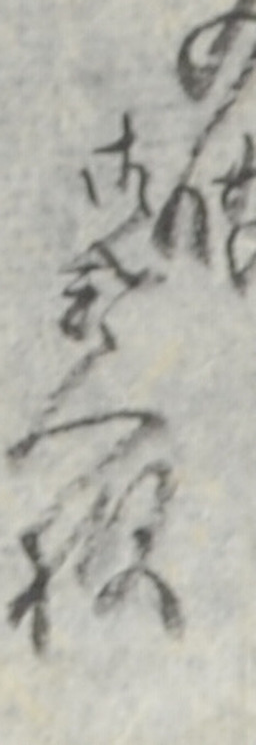御両人様
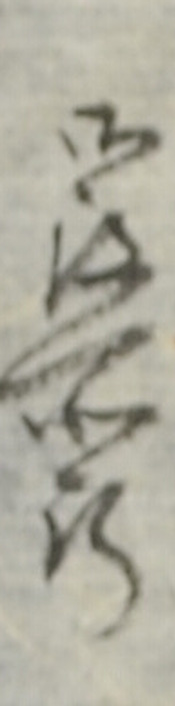御役所行
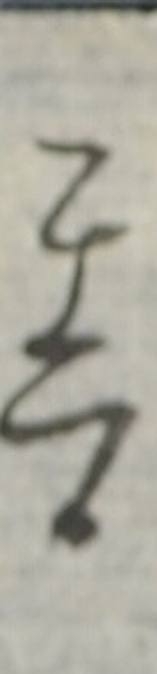十二日
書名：（金銭書上控）
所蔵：伊那市立高遠町図書館・合同会社AMANE
